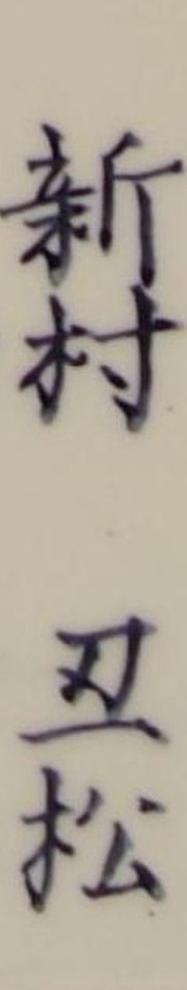新村丑松
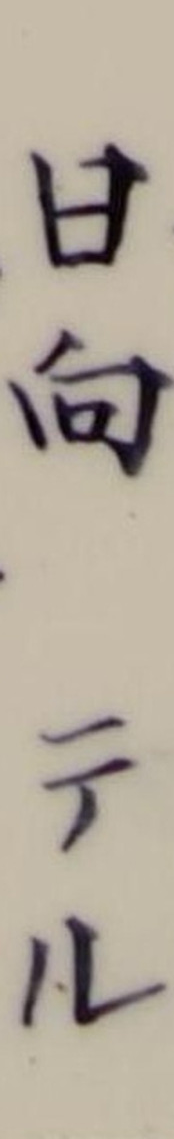日向テル
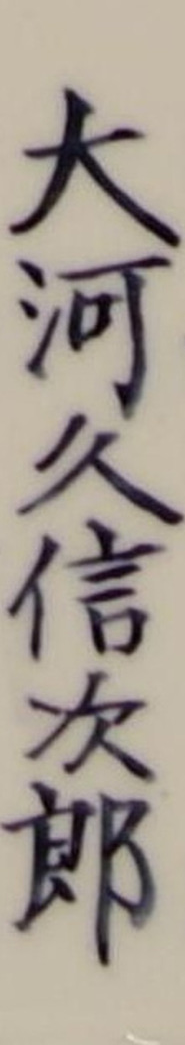大河久信次郎
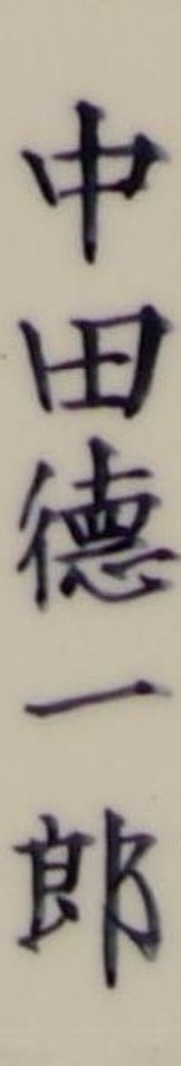中田徳一郎
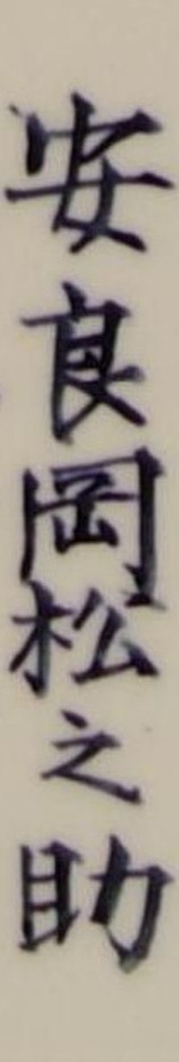安良岡松之助
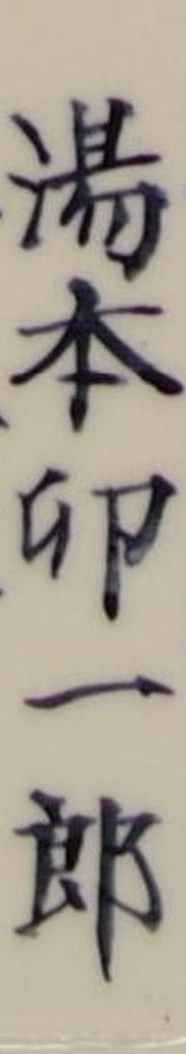湯本卯一郎
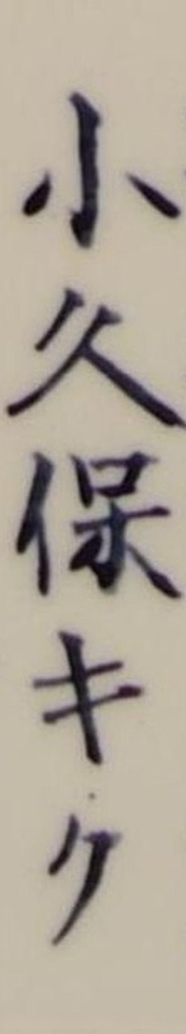小久保キク
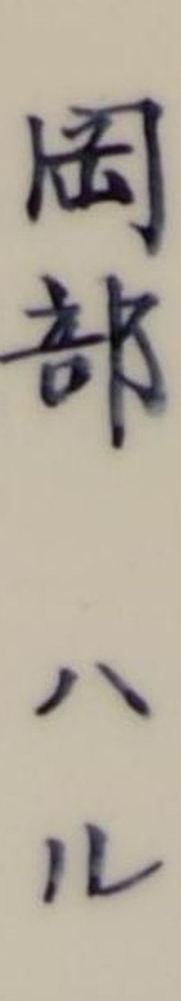岡部ハル
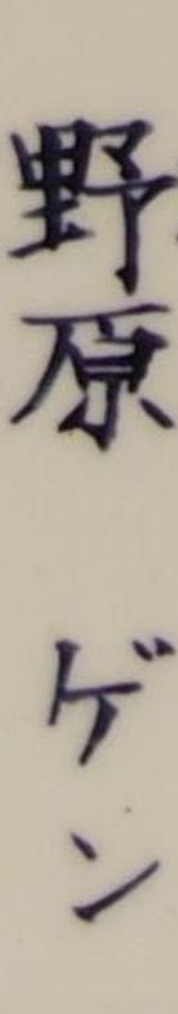野原ゲン
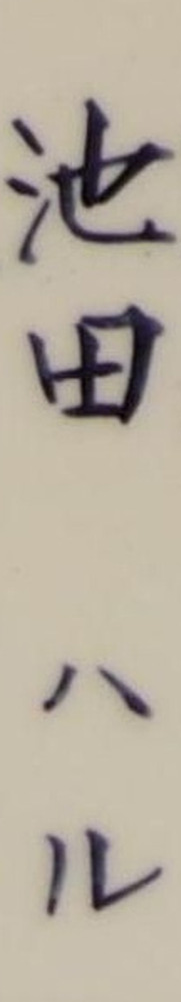池田ハル
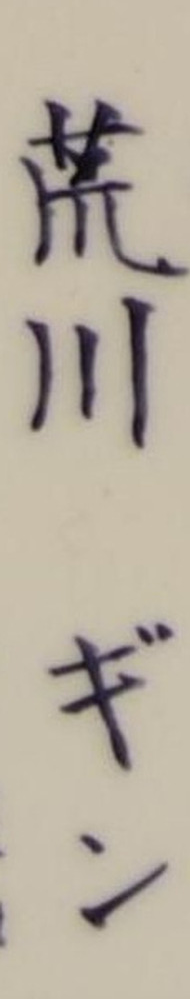荒川ギン
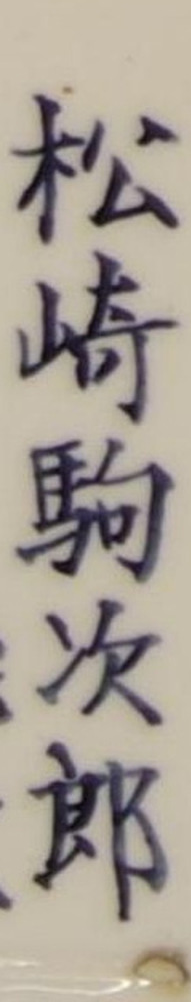松崎駒次郎

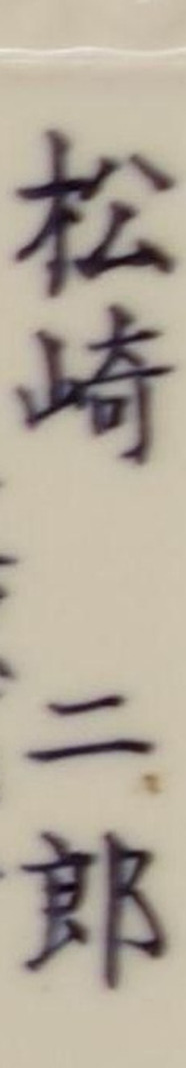松崎二郎
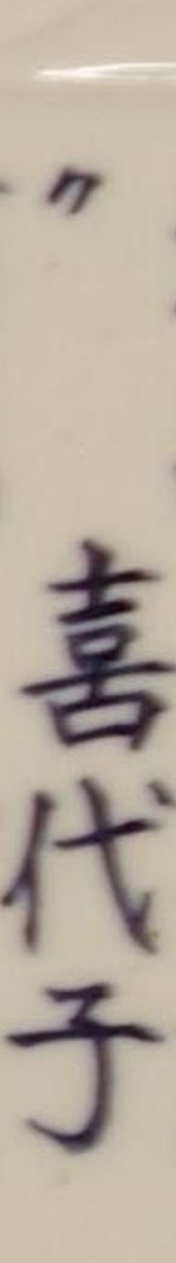喜代子
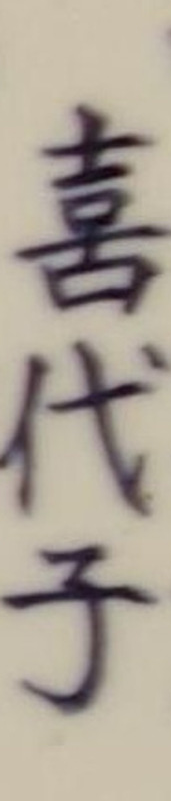喜代子
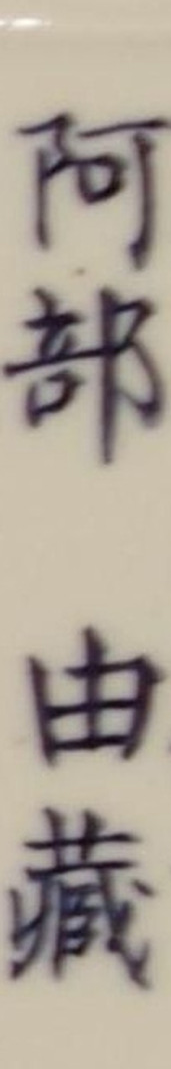阿部由蔵
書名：E~L
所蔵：高野山金剛峯寺
